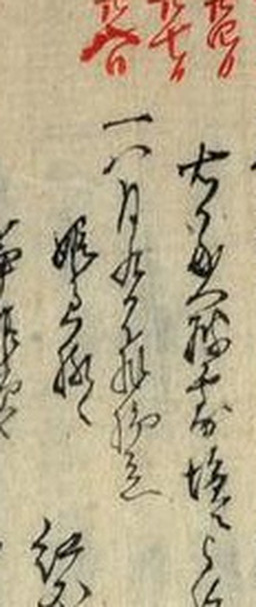一八月九日飛脚立
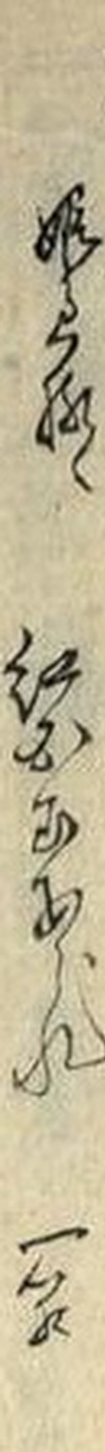姫君様へ紅白玉あられ一箱
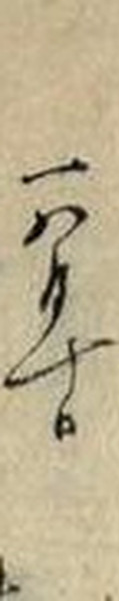一八月十日
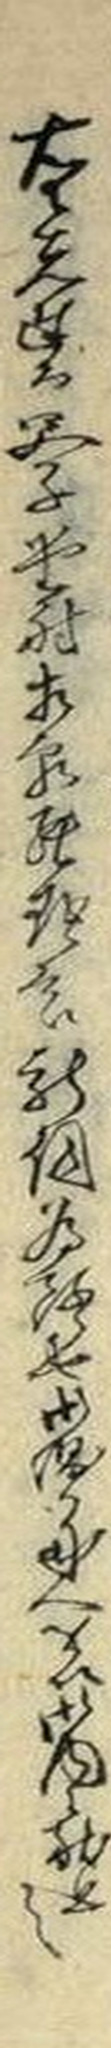右者先達而父子堂射相願罷越候節新調為改候由御側御用人を以御内々献上之
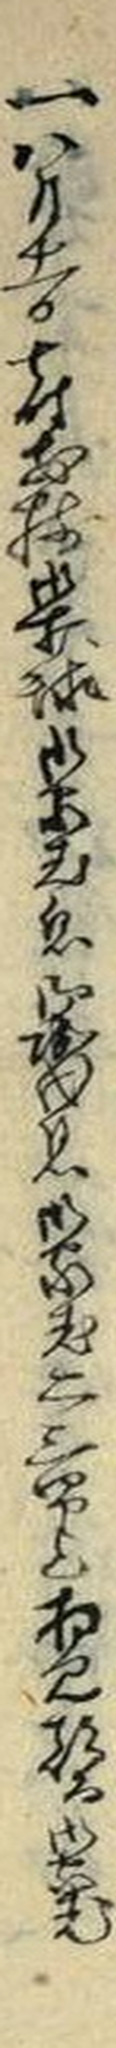一八月十一日七時前揃御打毬御家老息御城代息御家老二三男迄拝見都而御家老

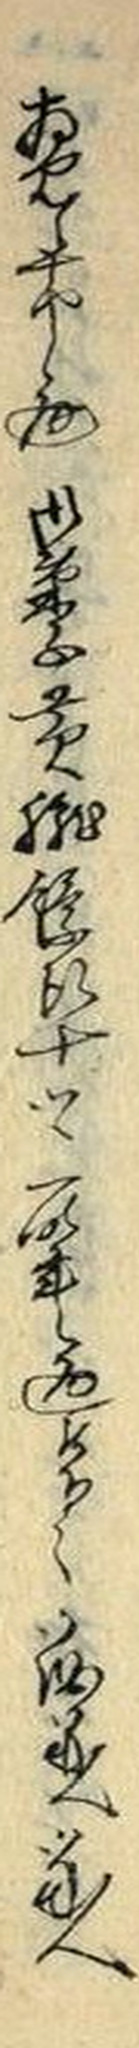拝見之節之通御菓子黄朧饅頭十ツゝ一昨年之通被下之御側御用人御用人
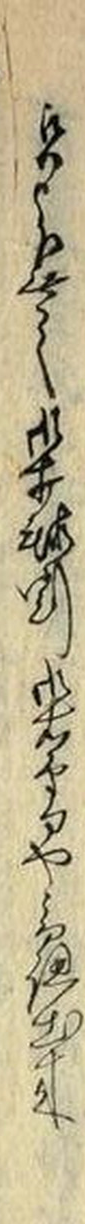江ハ被下無之御打毬割御右筆歩やニ而認出来
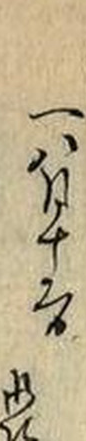一八月十二日
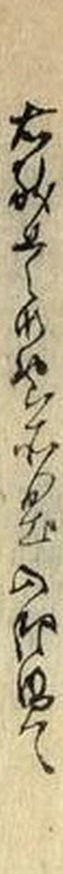右献上之御台所ゟ出入御覧候
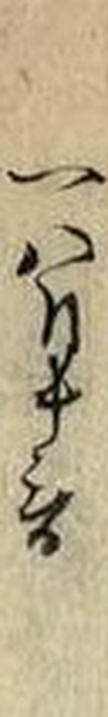一八月十二日
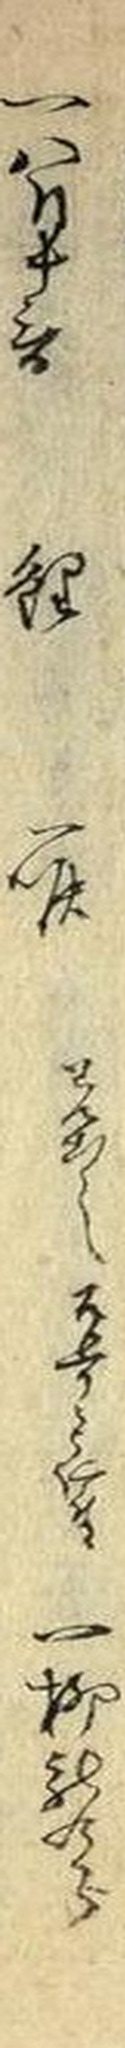一八月十三日鯉一喉差出之召上り被仰付候一柳新九郎
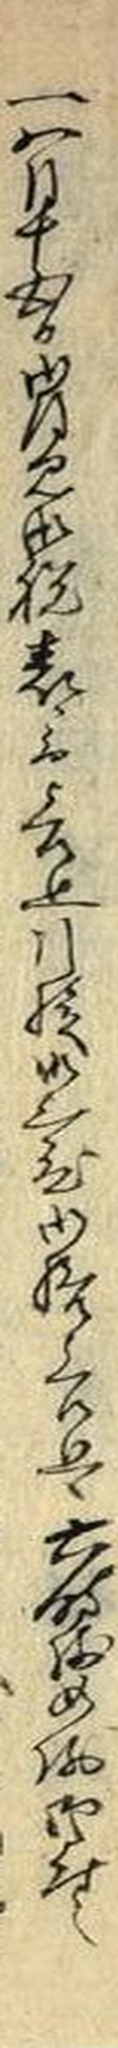一八月十五日御月見御祝表ニ而被召上引続御三度御膳被召上候六時揃如例御座之
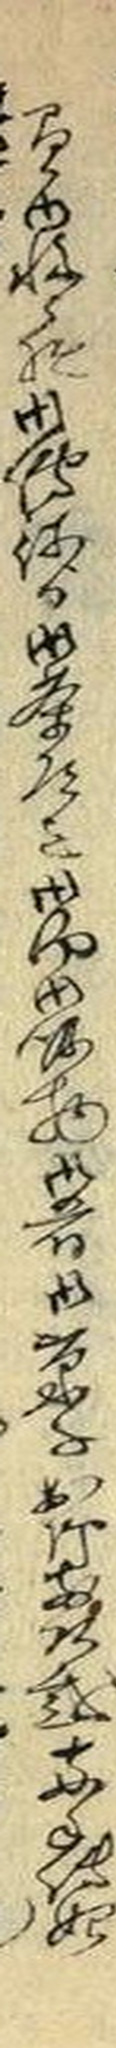間内移被遊御傅役ゟ御茶道迄御酒御吸物御肴御菓子於御前頂戴両手伝始
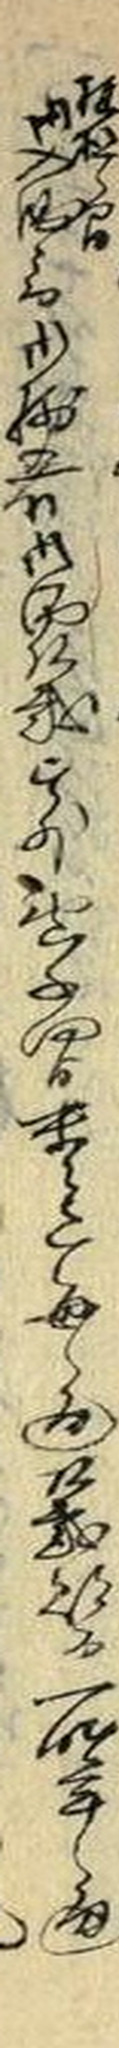韃靼之間御入側ニ而御揃肴御酒頂戴其外台子向ゟ未々迄毎之通頂戴都而一昨年之通
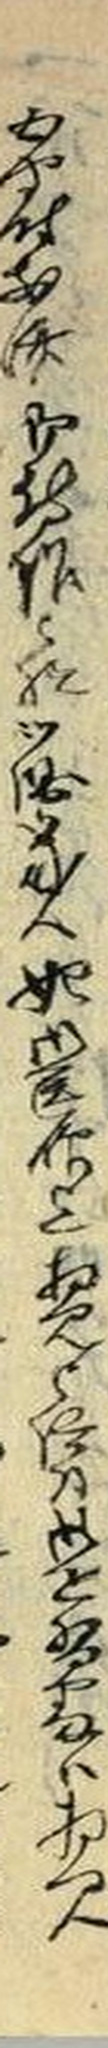五半時前済御詩作被遊御側御用人始御医師迄拝見被仰付御近習番ハ拝見
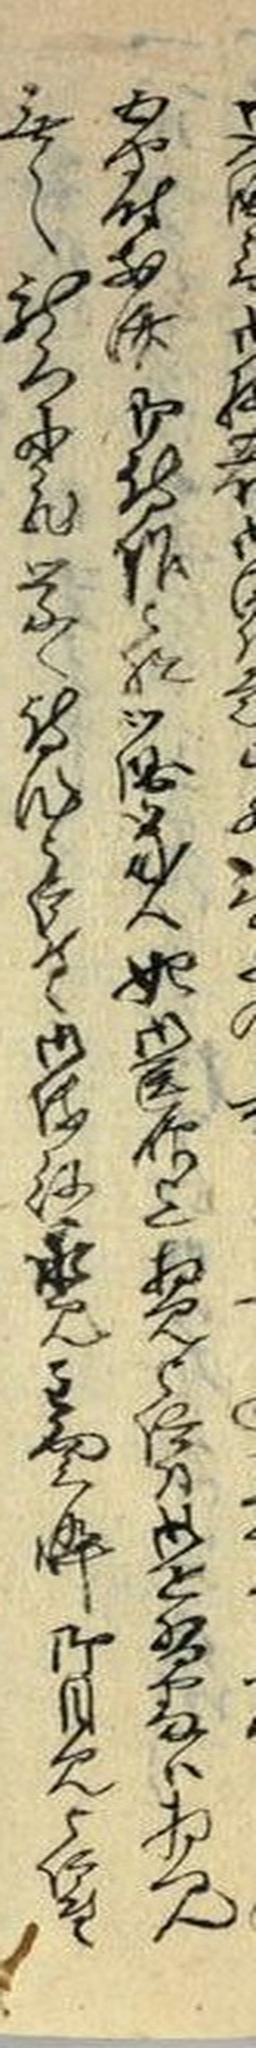無之新右衛門丹蔵栄へ詩作被仰付候御傅役永見主殿伜御目見被仰付候
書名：少傅日録抄（斉承付側向頭取日記、在国）
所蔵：福井県文書館 Fukui Prefectural Archives
